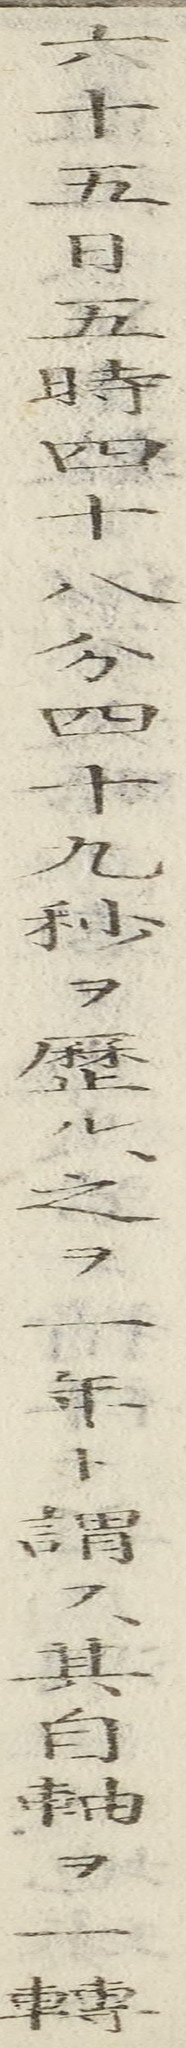六十五日五時四十八分四十九秒ヲ歴ル、之ヲ一年ト謂フ、其自軸ヲ一転
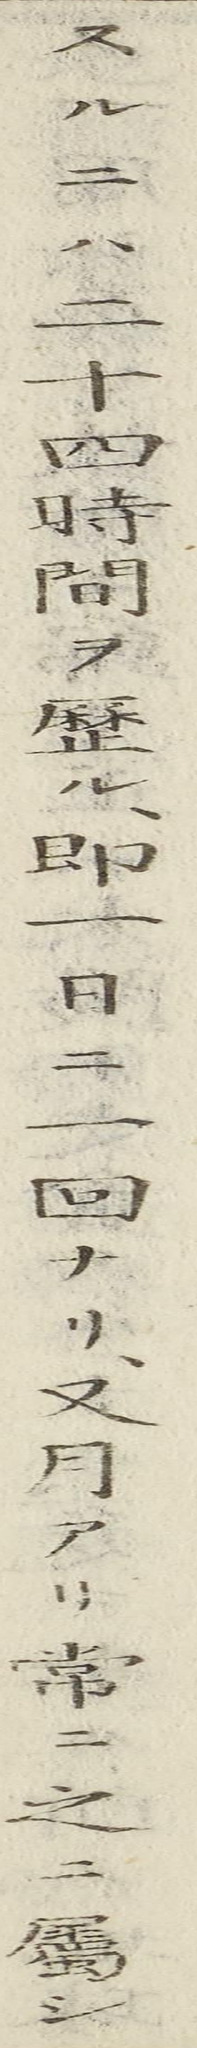スルニハ二十四時間ヲ歴ル、即一日ニ一回ナリ、又月アリ常ニ之ニ属シ
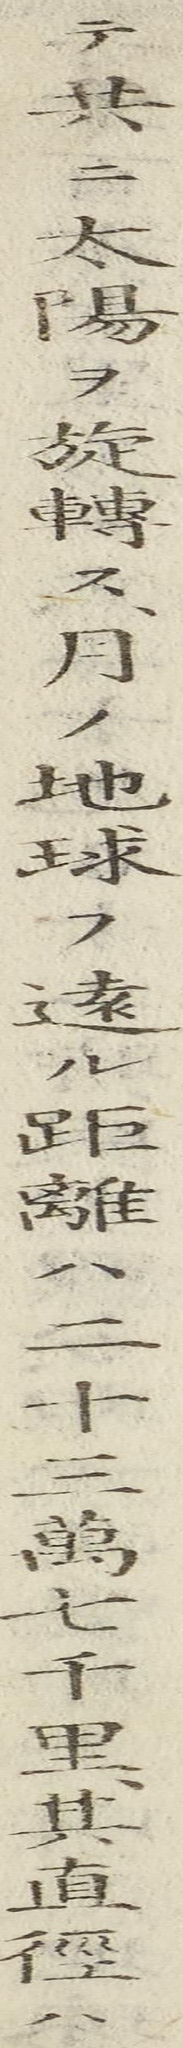テ共ニ太陽ヲ旋転ス、月ノ地球ヲ遠ル距離ハ二十三万七千里、其直径ハ

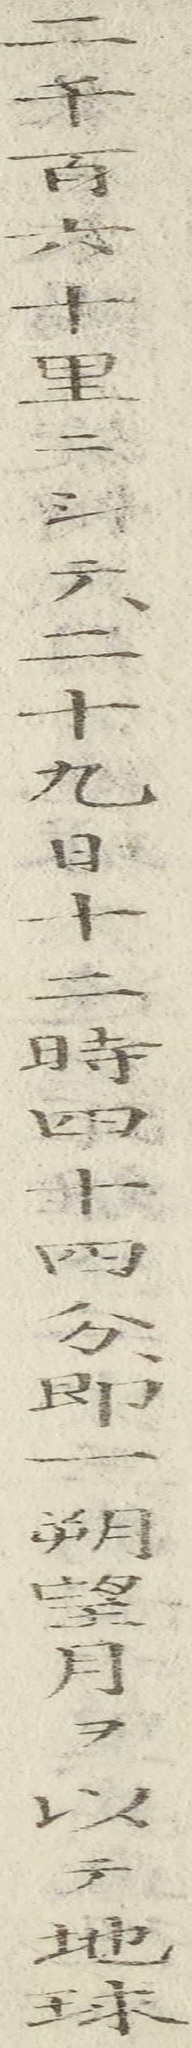ニ千百六十里ニシテ、二十九日十二時四十四分、即一朔望月ヲ以テ地球
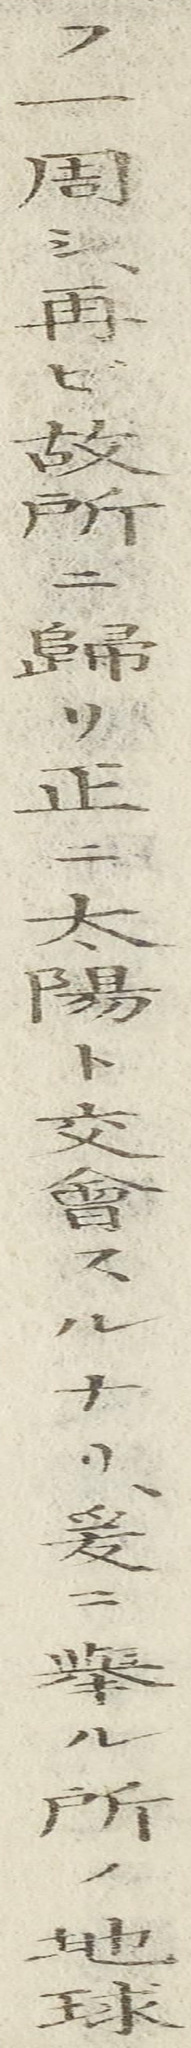ヲ一周シ、再ビ故所ニ帰リ正ニ太陽ト交会スルナリ、爰ニ挙ル所ノ地球
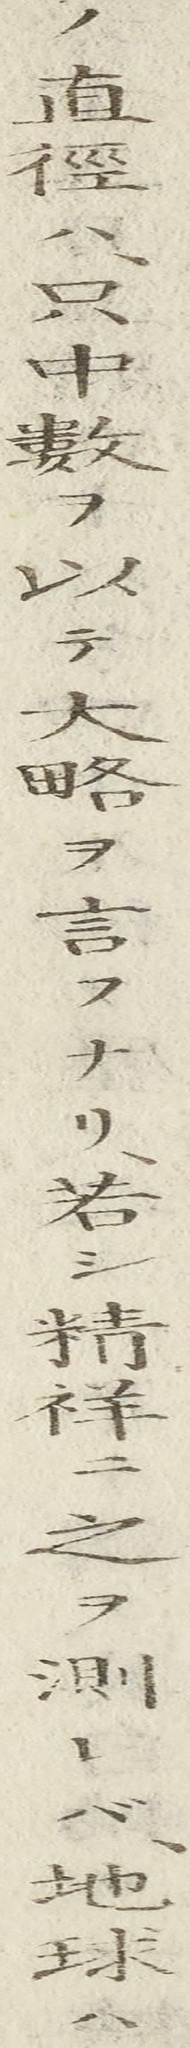ノ直径ハ、只中数ヲ以テ大略ヲ言フナリ、若シ精祥ニ之ヲ測レバ、地球ハ
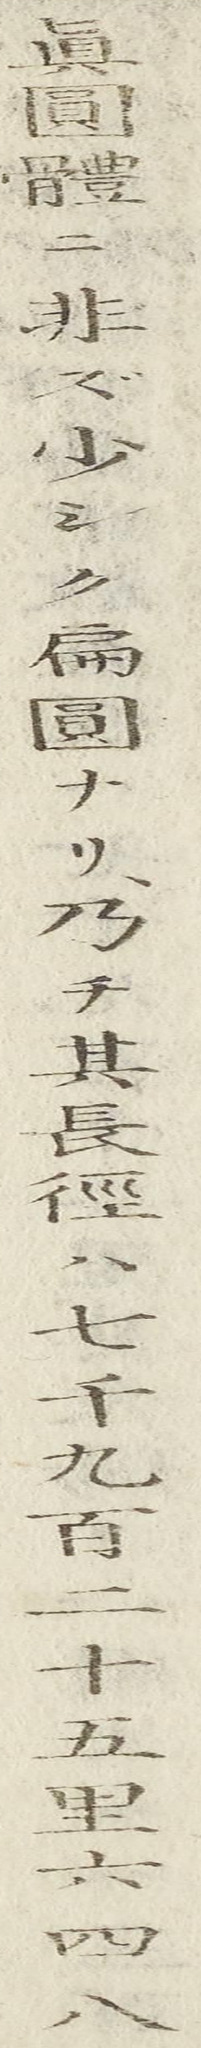真円体ニ非ズ少シク扁円ナリ、乃チ其長径ハ七千九百二十五里六四八
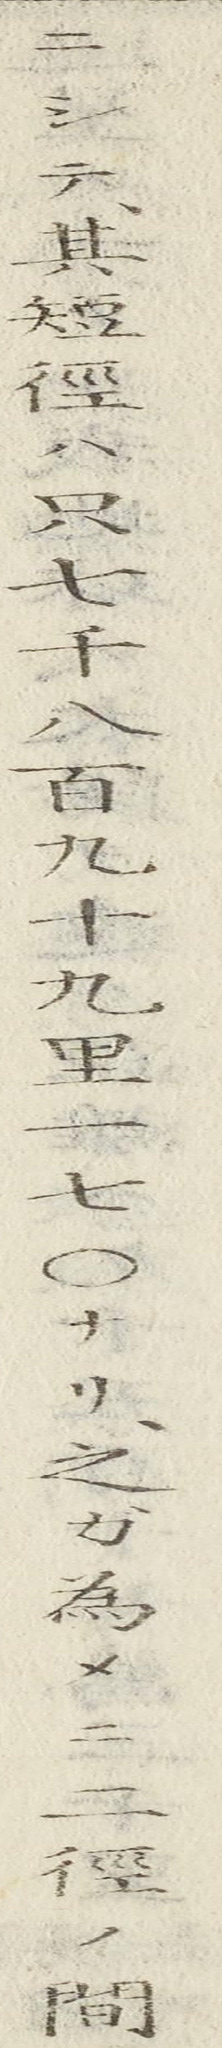ニシテ、其短径ハ只七千八百九十九里一七〇ナリ、之ガ為メニ二径ノ間
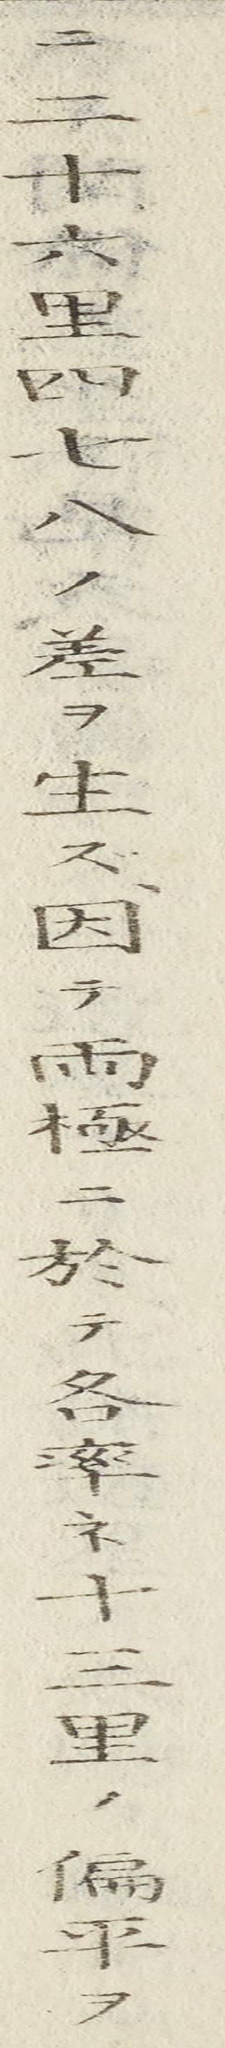ニ二十六里四七八ノ差ヲ生ス、因テ両極ニ於テ各率ネ十三里ノ偏平ヲ
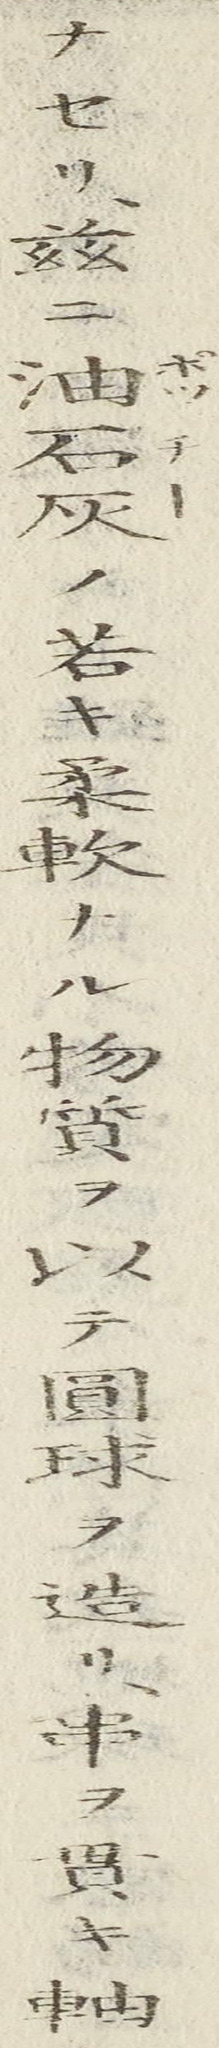ナセリ、爰ニ油石灰ノ若キ柔軟ナル物質ヲ以テ円球ヲ造リ、串ヲ貫キ軸
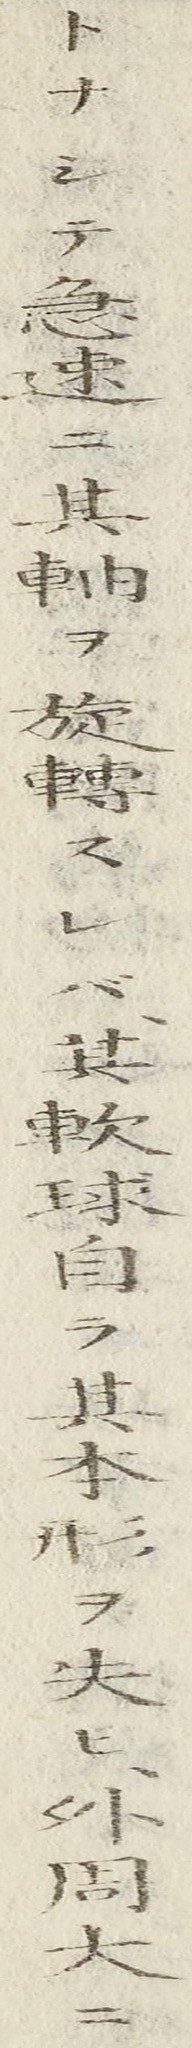トナシテ急速ニ其軸ヲ旋転スレバ、其軟球自ラ基本形ヲ失ヒ、外周大ニ
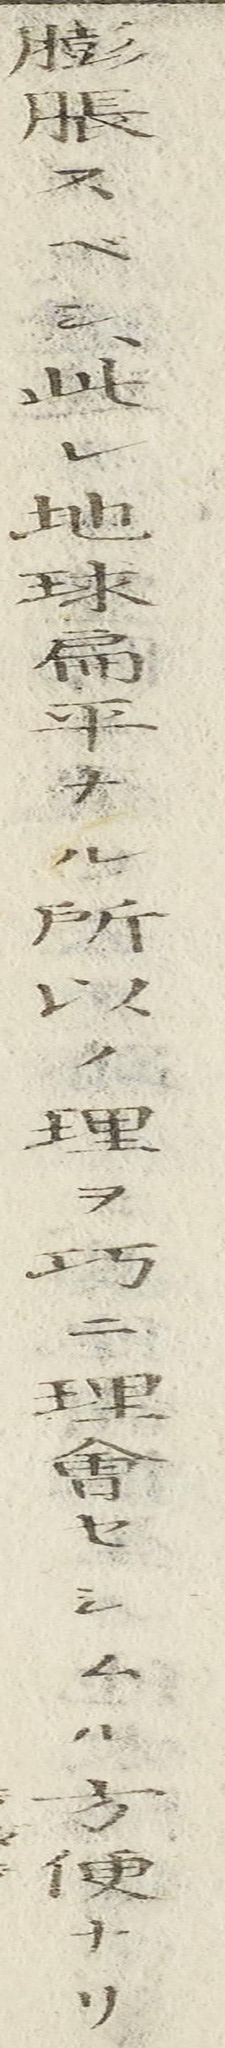膨張スベシ、此レ地球扁平ナル所以ノ理ヲ巧ニ理会セシムル方便ナリ
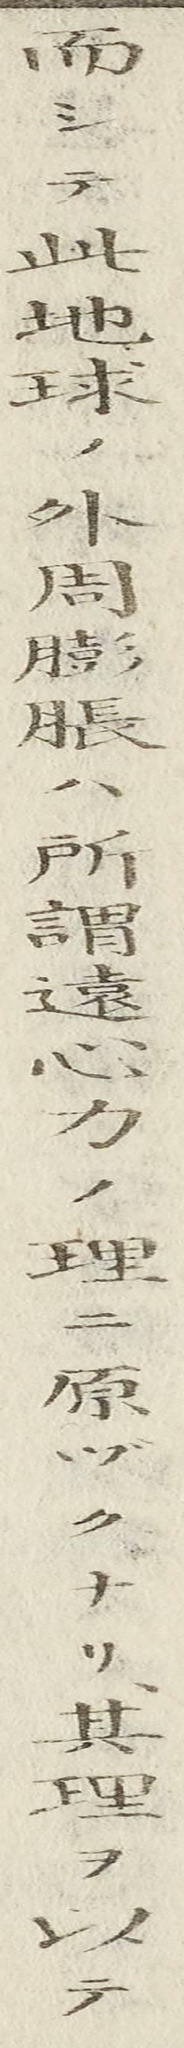而シテ此地球ノ外周膨張ハ所謂遠心力ノ理ニ原ヅクナリ、其理ヲ以テ
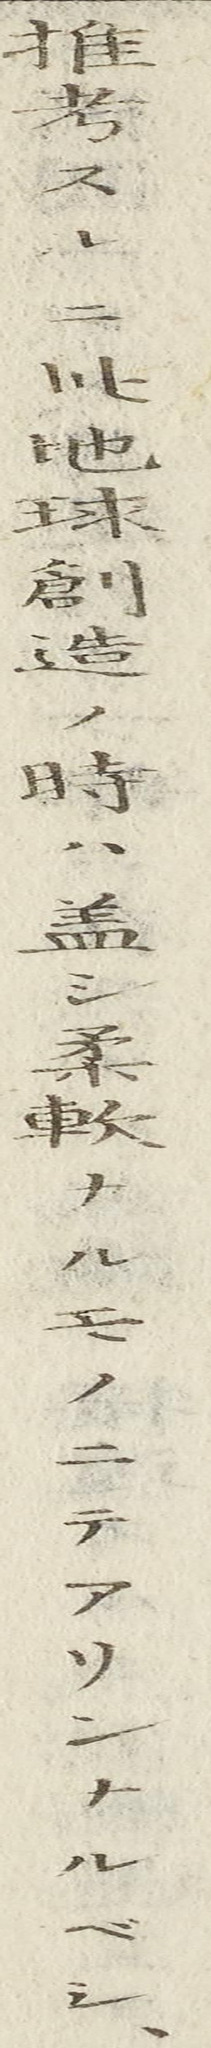推考スルニ此地球創造ノ時ハ盖シ柔軟ナルモノニテアリンナルベシ、
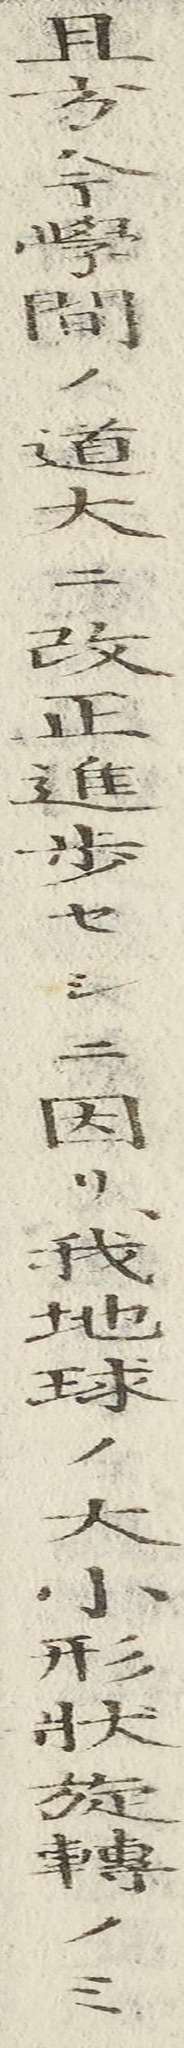且方今学問ノ道大ニ改正進歩セシニ因リ、我地球ノ大小形状旋転ノミ
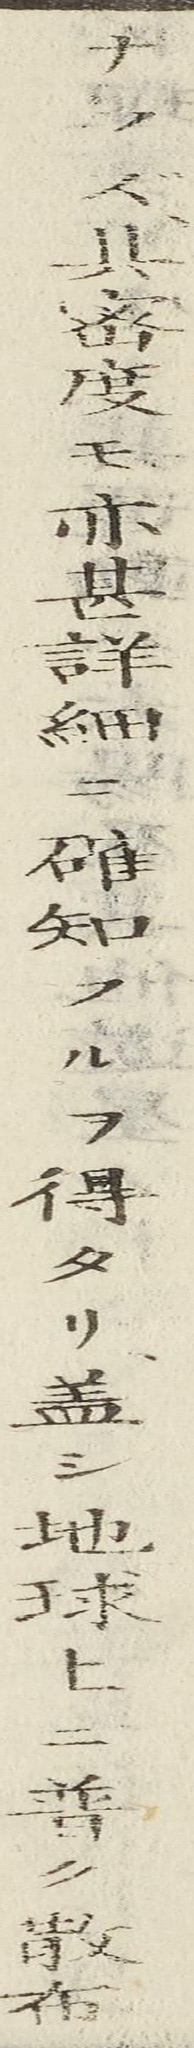ナラズ、其密度モ亦甚詳細ニ確知フルヲ得タリ、盖シ地球上ニ普ク散布
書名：百科全書　地文學　全
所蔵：東京大学地震研究所図書室 Earthquake Research Institute Library, The University of Tokyo, JAPAN
